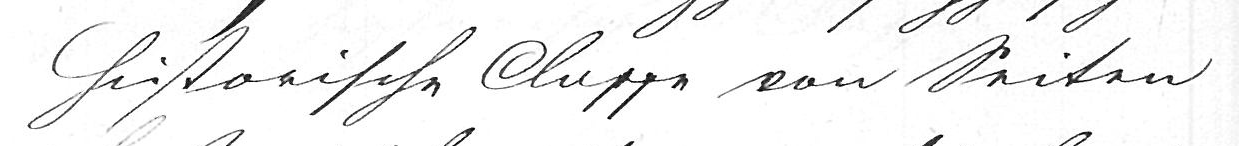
historische Classe von Seiten
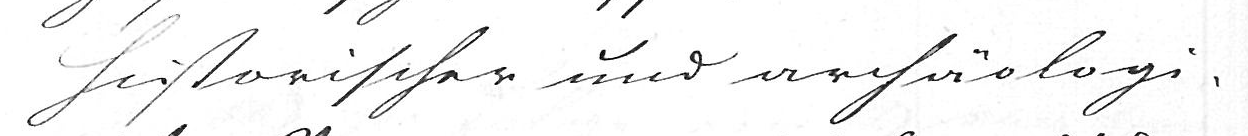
historischer und archäologi-
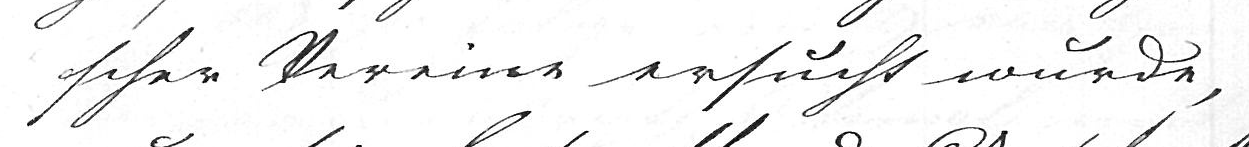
scher Vereine ersucht wurde,
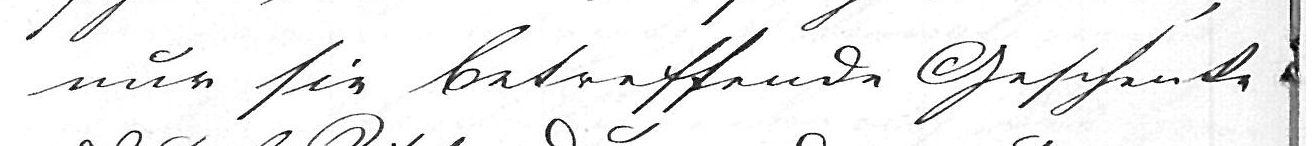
nur sie betreffende Geschenke
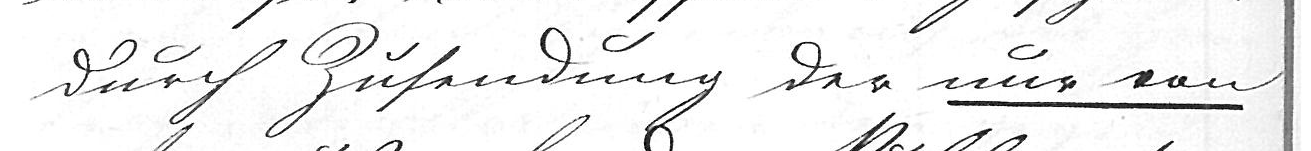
durch Zusendung der nur von
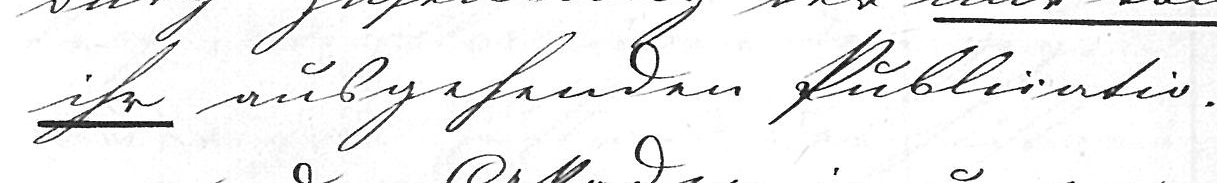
ihr ausgehenden Publicatio-
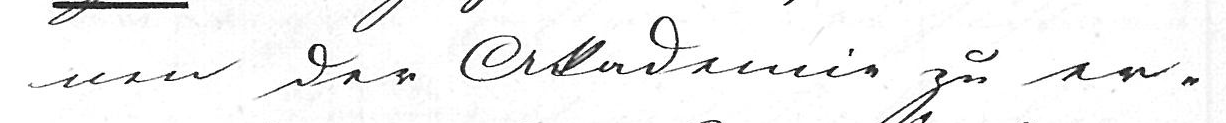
nen der Akademie zu er-
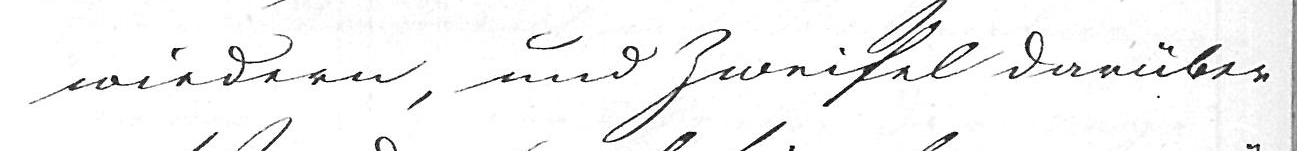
wiedern, und Zweifel darüber
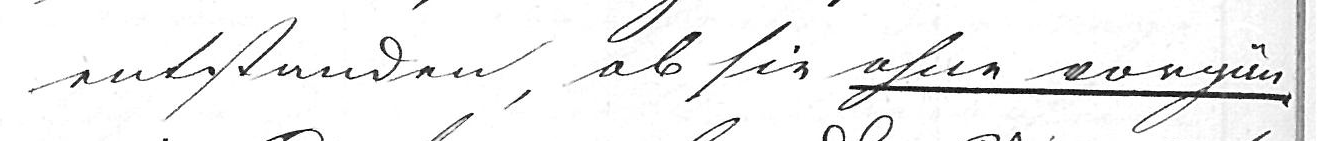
entstanden, ob sie ohne vorgän-
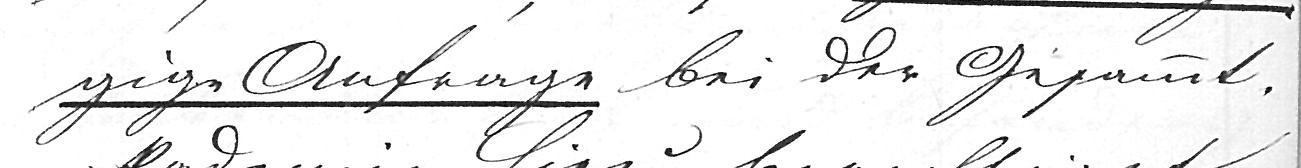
gige Anfrage bei der Gesammt-
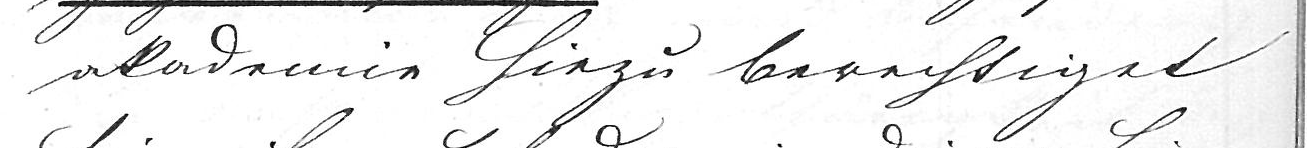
akademie hiezu berechtiget
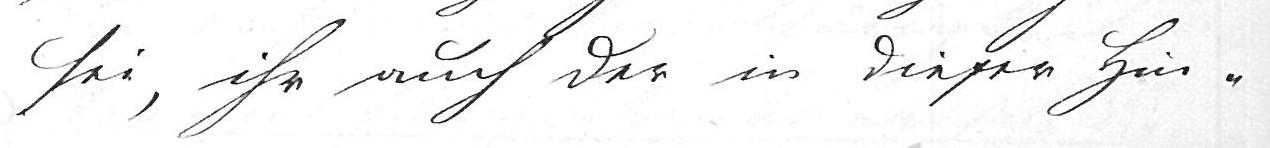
sei, ihre auch der in dieser Hin-
